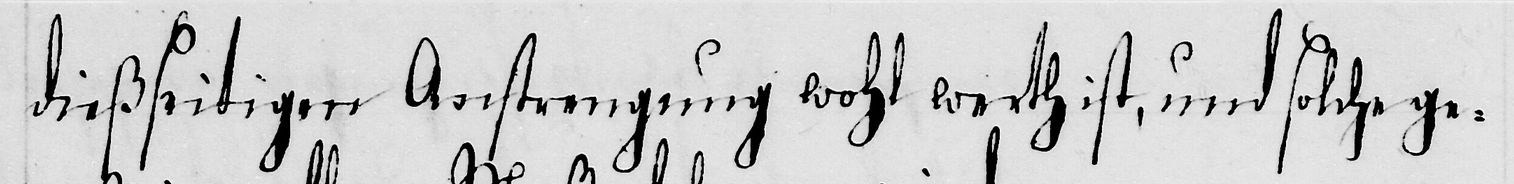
dießseitigen Anstrengung wohl werth ist, und solche ge¬
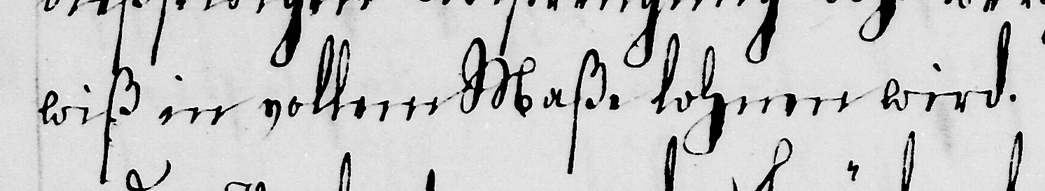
wiß in vollem Maße lohnen wird.
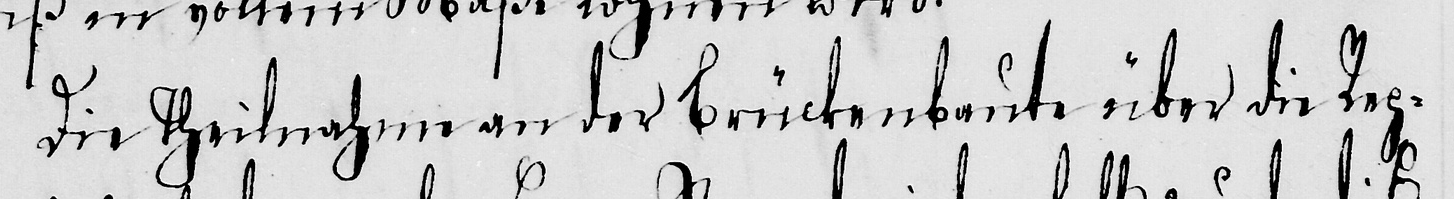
Die Theilnahme an der Brückenbaute über die Rep¬
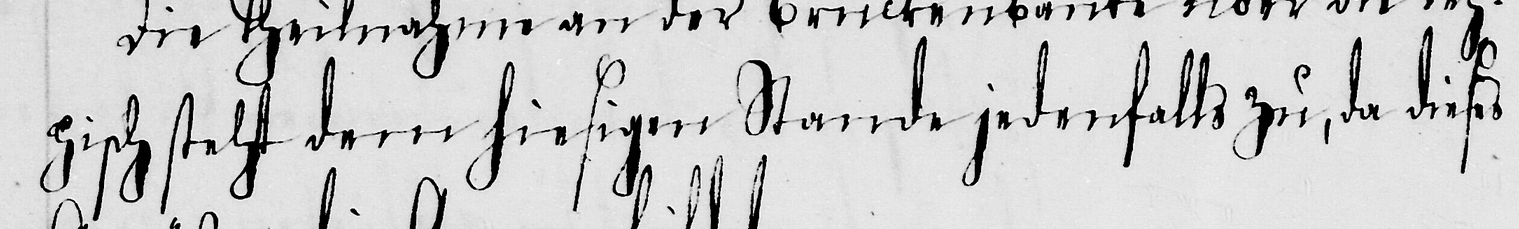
pisch steht dem hiesigen Stande jedenfalls zu, da die¬
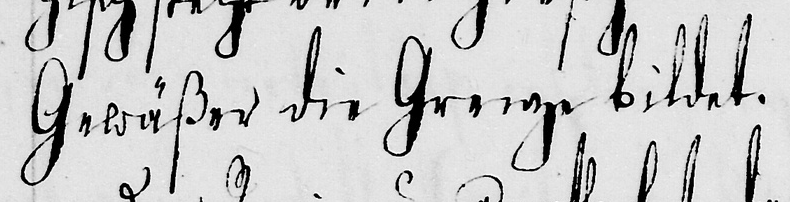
Gewäßer die Grenze bildet.
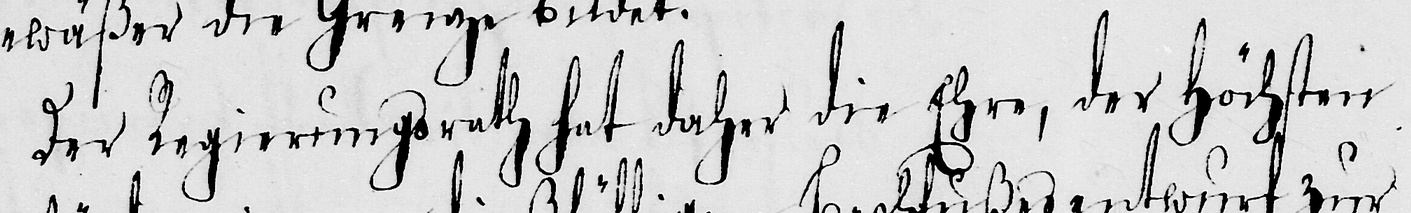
Der Regierungsrath hat daher die Ehre, der höchsten
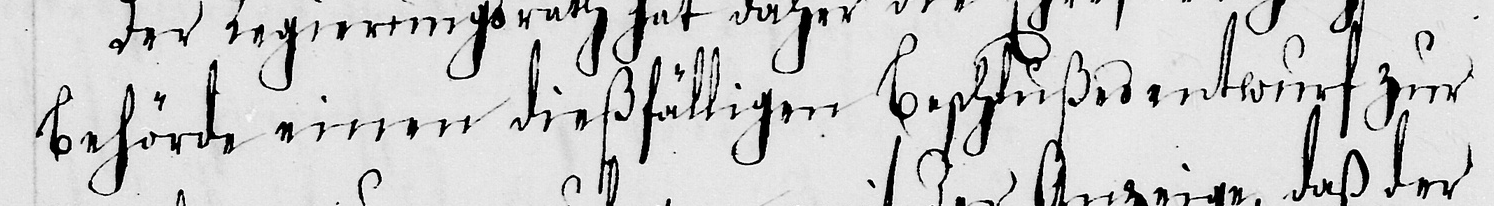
Behörde einen dießfälligen Beschlußesentwurf zur
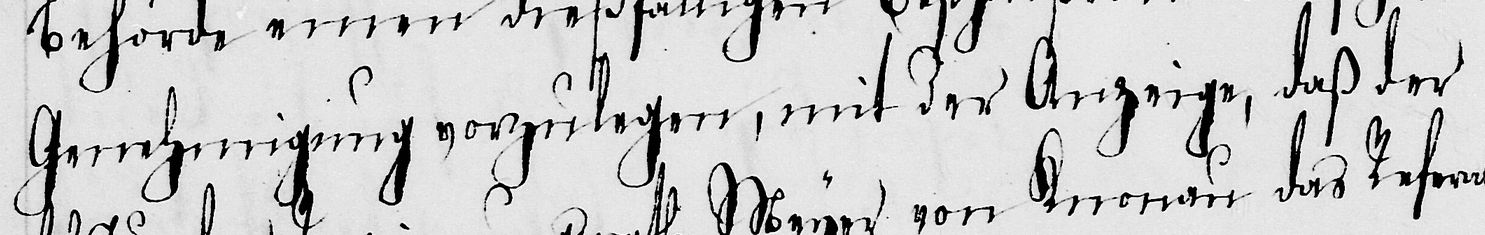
Genehmigung vorzulegen, mit der Anzeige, daß der
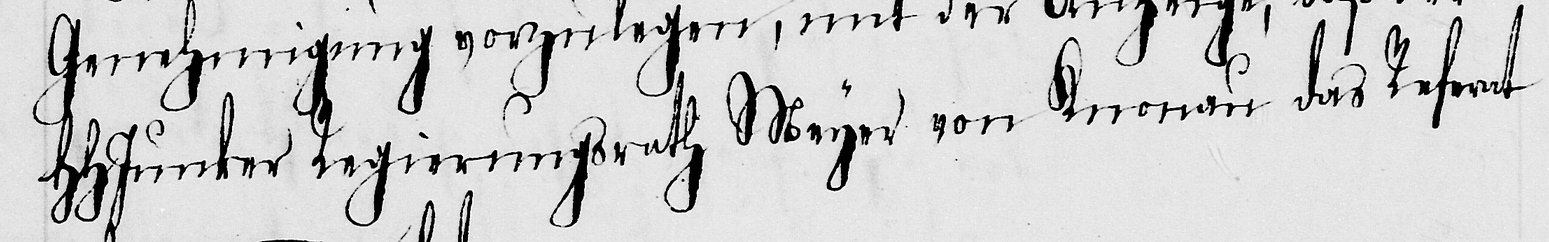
HHJunker Regierungsrath Meyer von Knonau das Referat
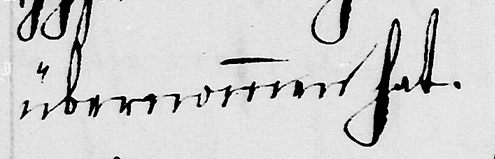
übernommen hat.
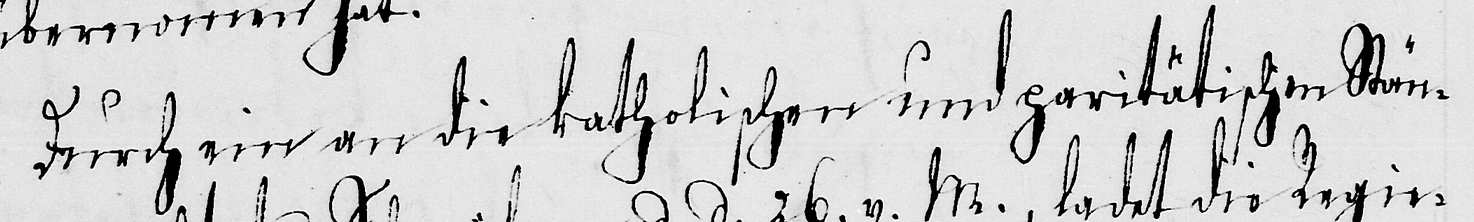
Durch ein an die katholischen und paritätischen Stän¬
